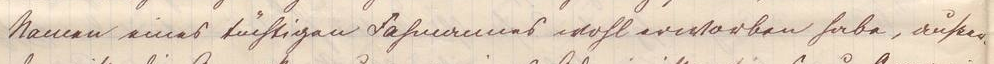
Namen eines tüchtigen Fachmannes wohl erworben habe, außer-
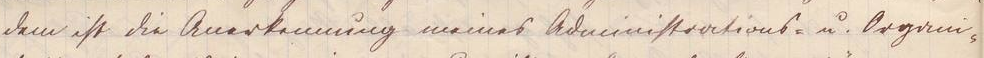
dem ist die Anerkennung meines Administrations- u. Organi-
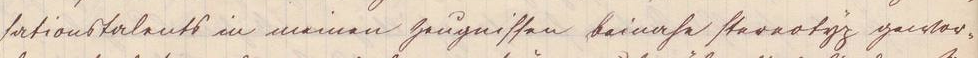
tionstalents in meinen Zeugnissen beinahe stereotyp gewor-
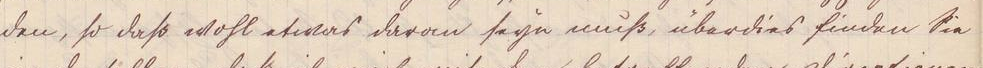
den, so daß wohl etwas daran seyn muß, überdies finden Sie
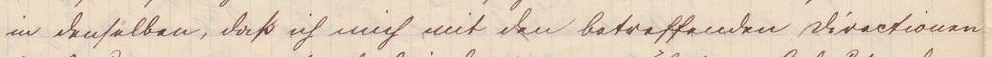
in denselben, daß ich mich mit den betreffenden Directionen
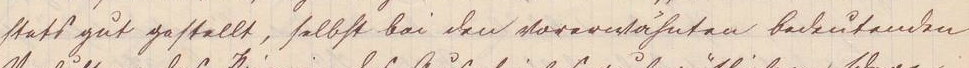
stets gut gestellt, selbst bei den vorerwähnten bedeutenden
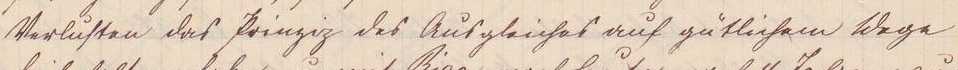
Verlusten das Prinzip des Ausgleiches auf gütlichem Wege
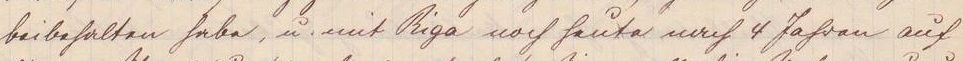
beibehalten habe, u. mit Riga noch heute nach 4 Jahren auf
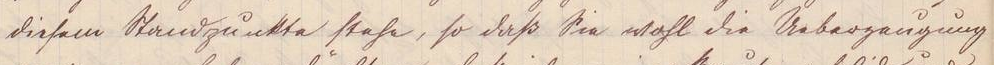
diesem Standpunkte stehe, so daß Sie wohl die Ueberzeugung
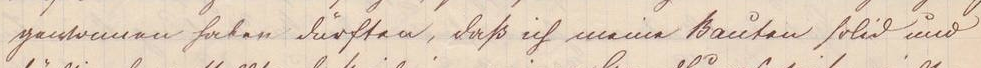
gewonnen haben dürften, daß ich meine Bauten solid und
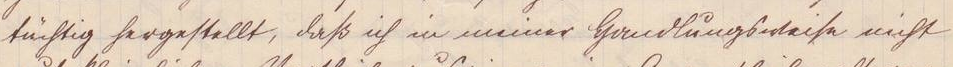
tüchtig hergestellt, daß ich in meiner Handlungsweise nicht
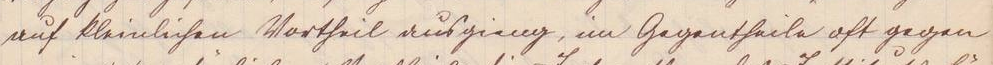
auf kleinlichen Vortheil ausgieng, im Gegentheile oft gegen
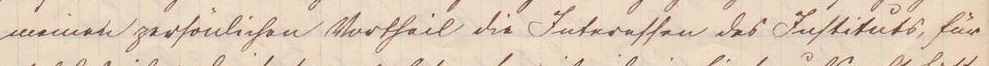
meinen persönlichen Vortheil die Interessen des Instituts, für
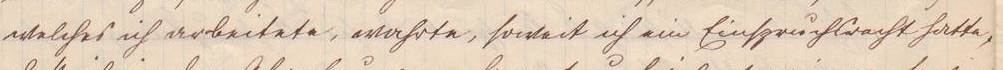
welches ich arbeitete, wahrte, soweit ich ein Einspruchsrecht hatte,
